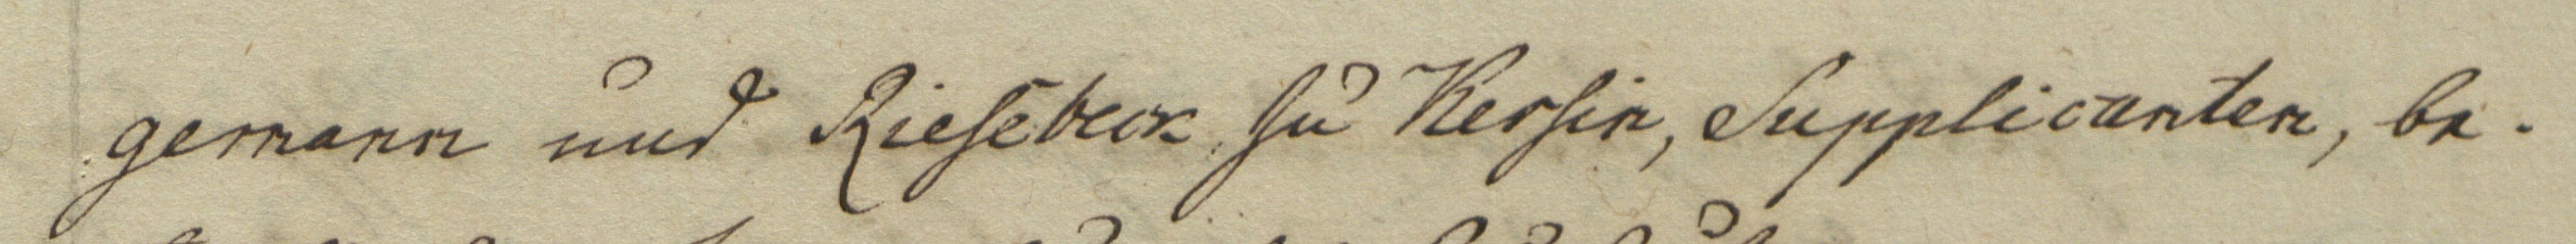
gemann und Riesebeck zu Kessin, Supplicanten, be¬
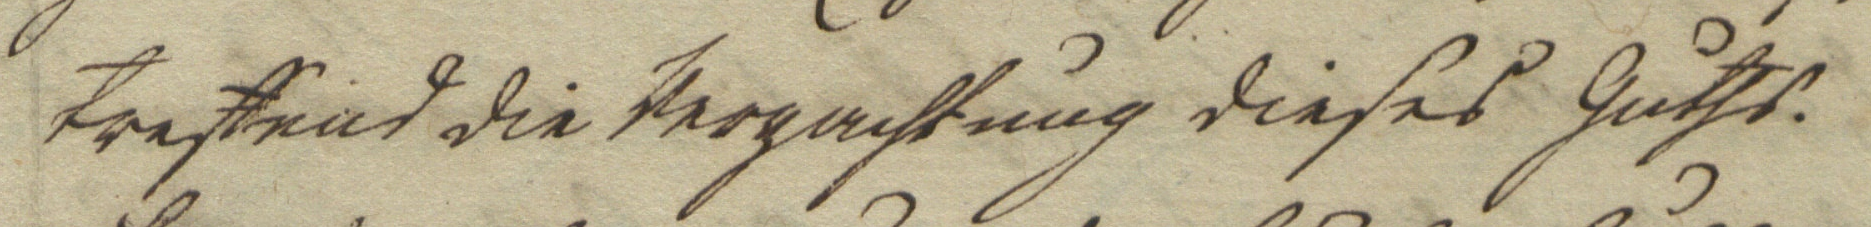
treffend die Verpachtung dieses Guths.
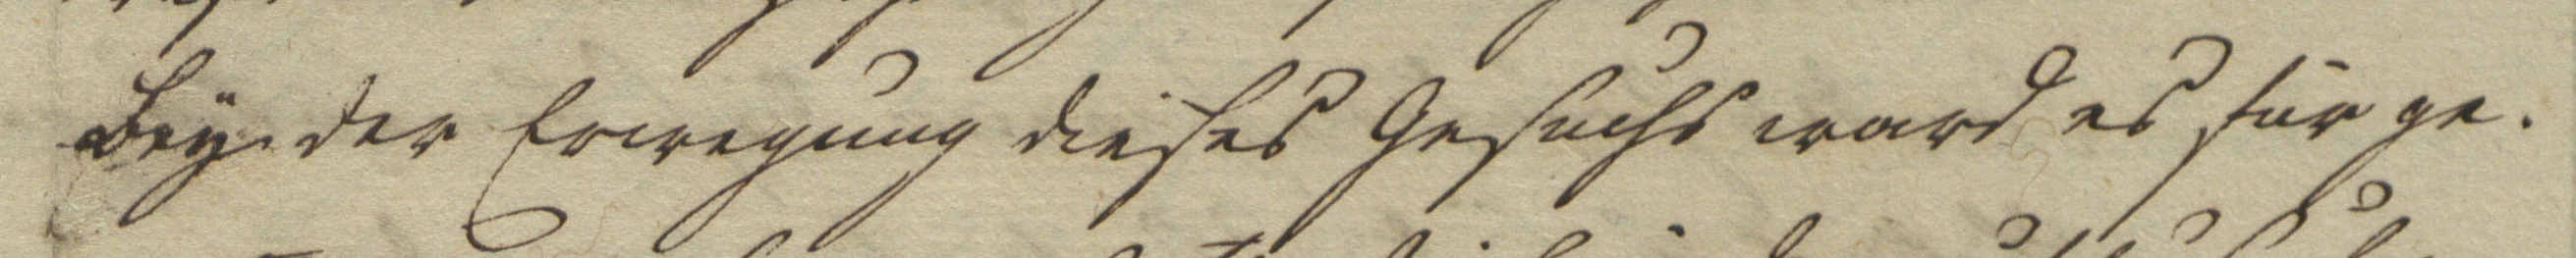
Bey der Erwegung dieses Gesuchs ward es für ge¬
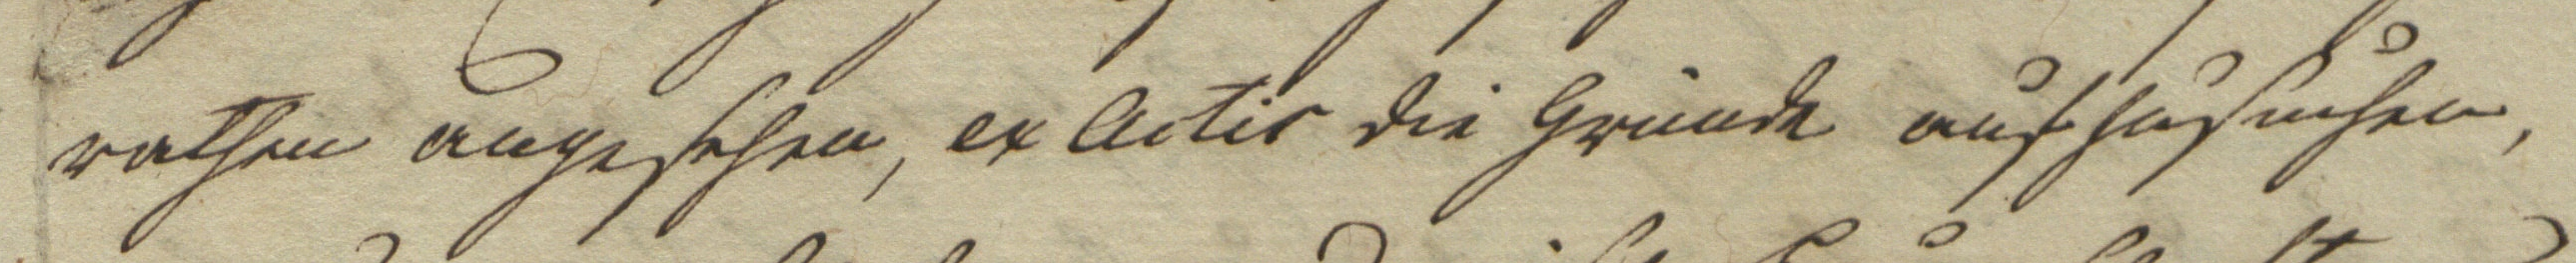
rathen angesehen, ex Actis die Gründe aufzusuchen,
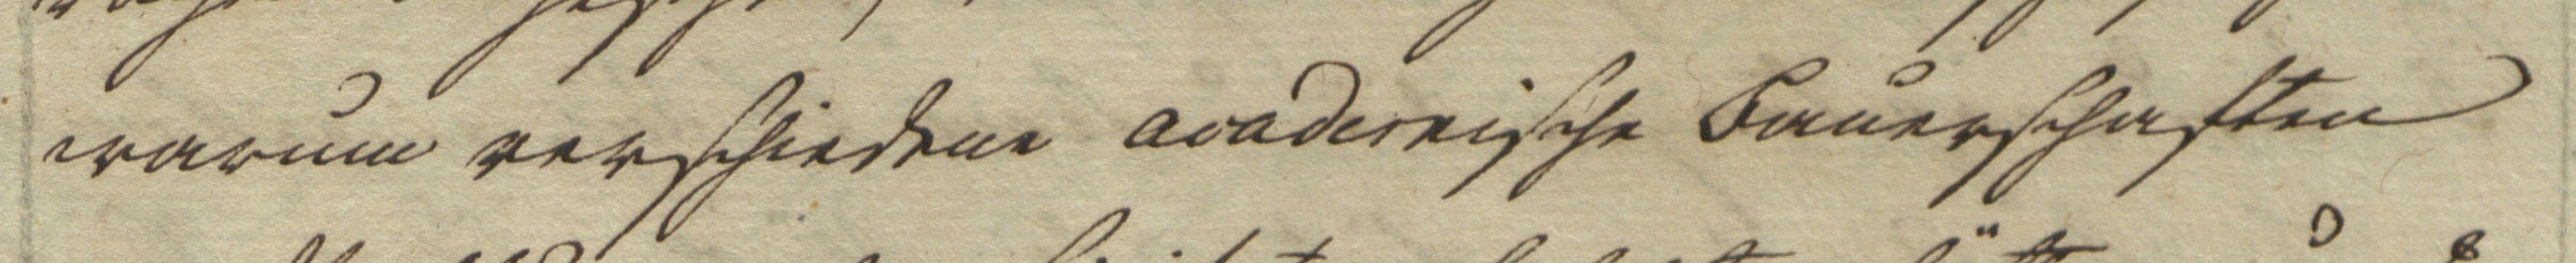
warum verschiedene academische Bauerschaften
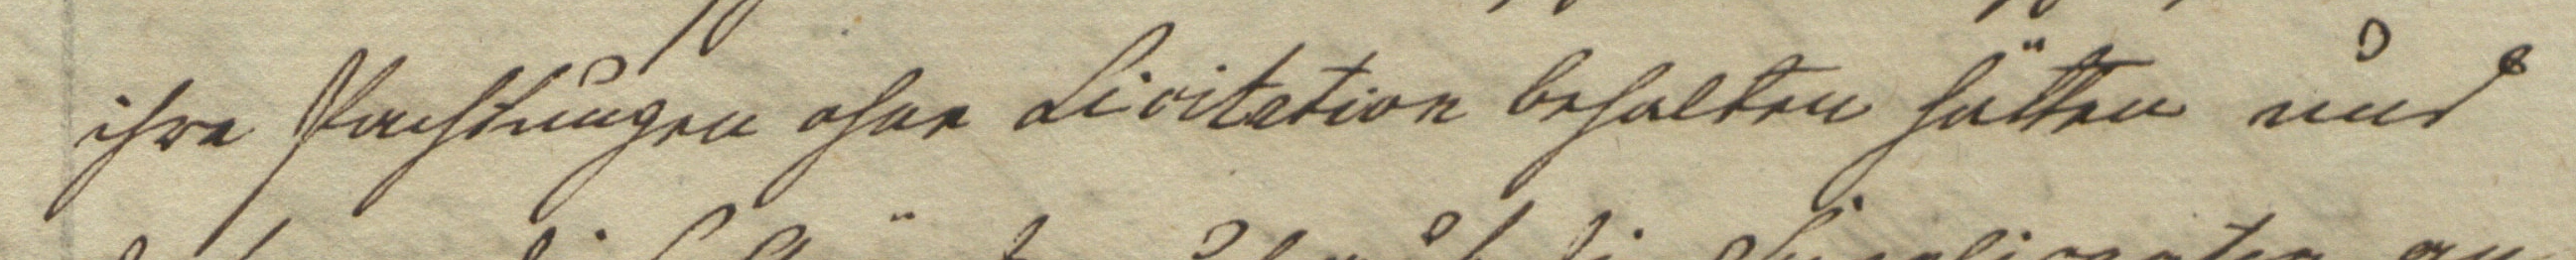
ihre Pachtungen ohne Licitation behalten hätten und
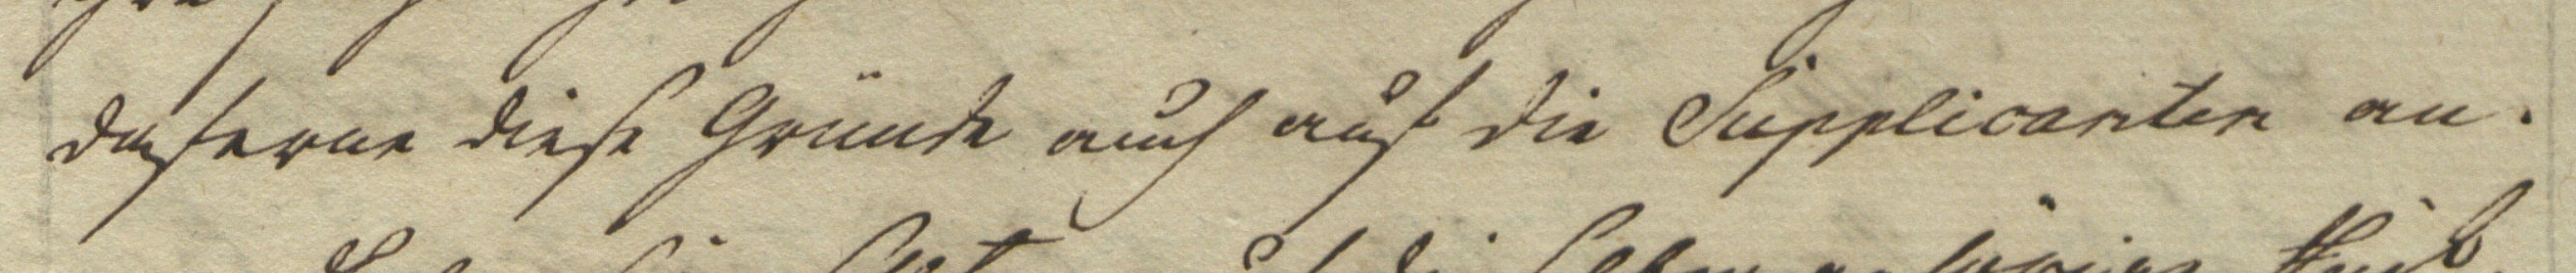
daferne diese Gründe auch auf die Supplicanten an¬
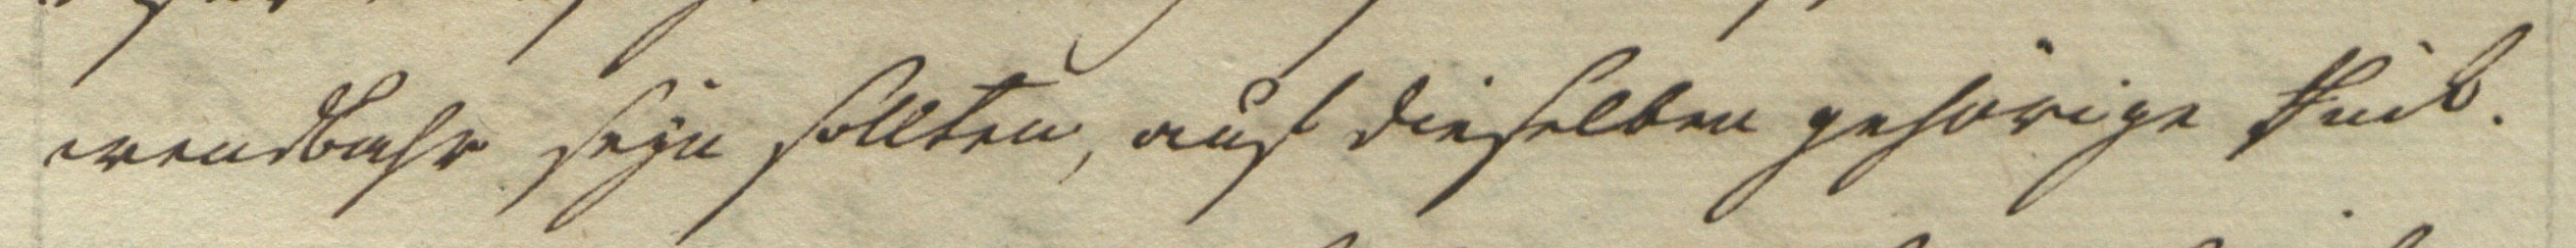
wendbahr seyn sollten, auf dieselben gehörige Rück¬
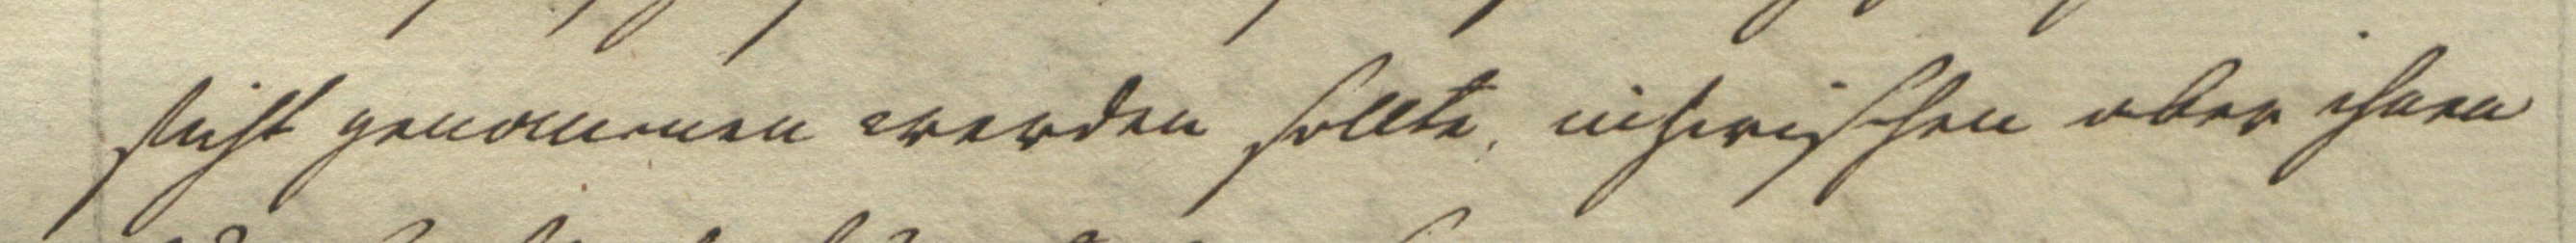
sicht genommen werden sollte, inzwischen aber ihnen
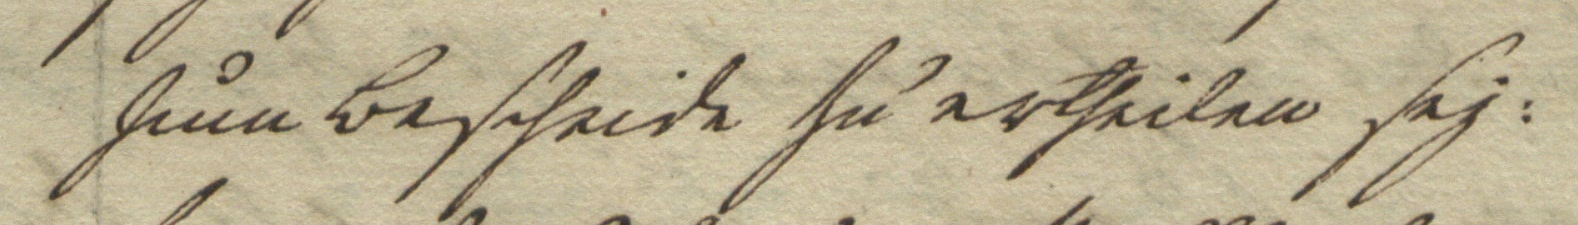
zum Bescheide zu ertheilen sey:
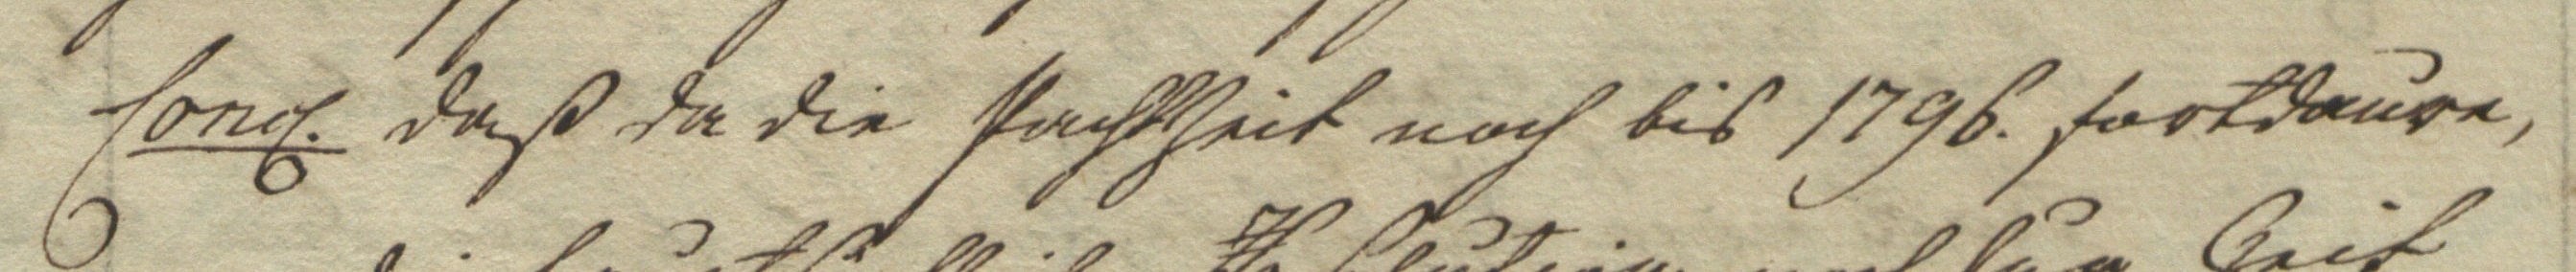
Concl. daß da die Pachtzeit noch bis 1796 fortdaure,
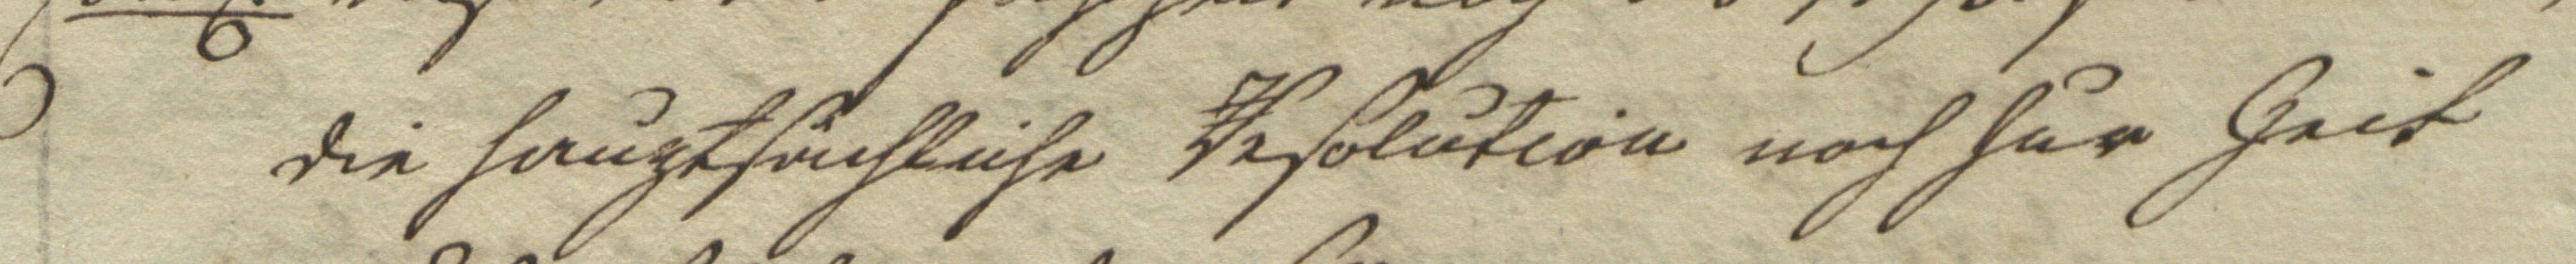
die hauptsächliche Resolution noch zur Zeit
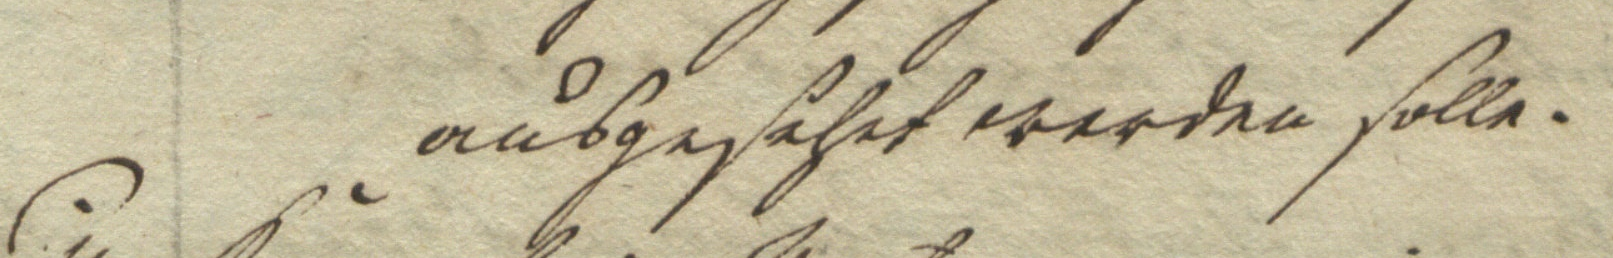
ausgesetzet werden solle.
